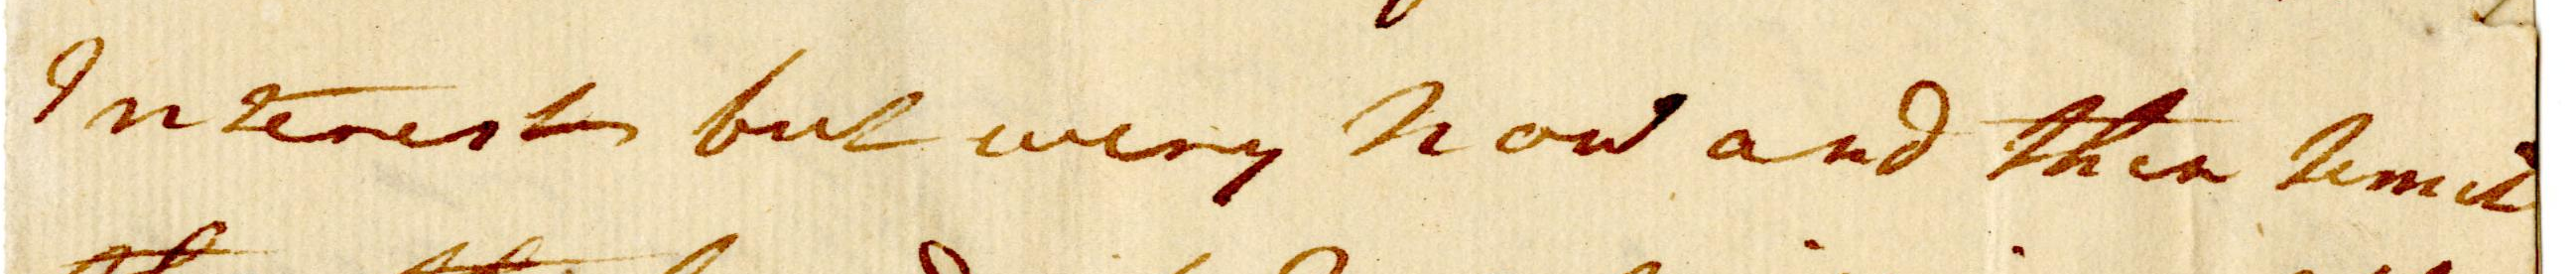Interest but wary now and then remit
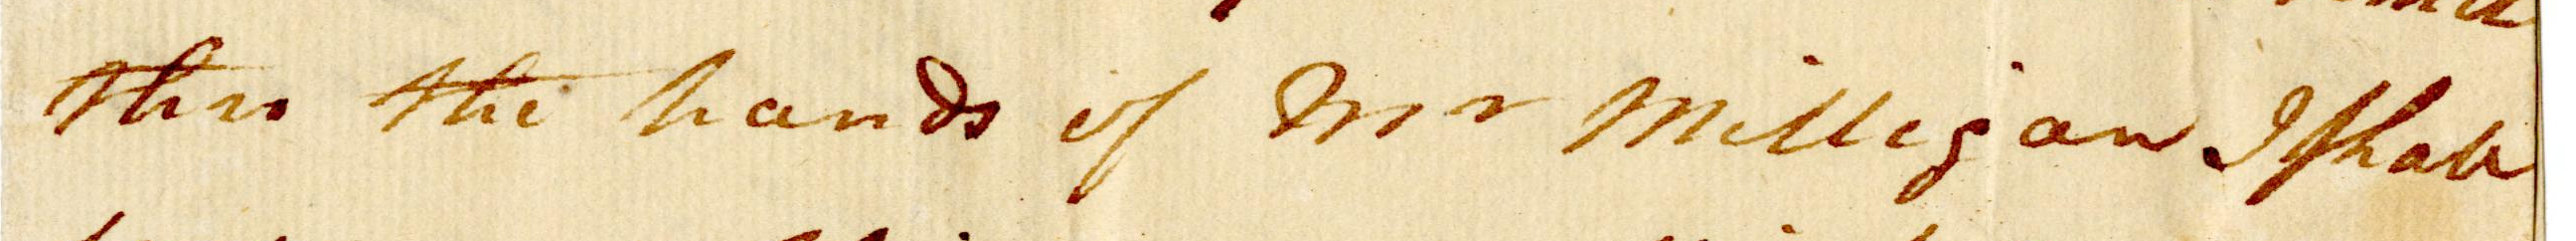this the hands of M^r Milligan I shall
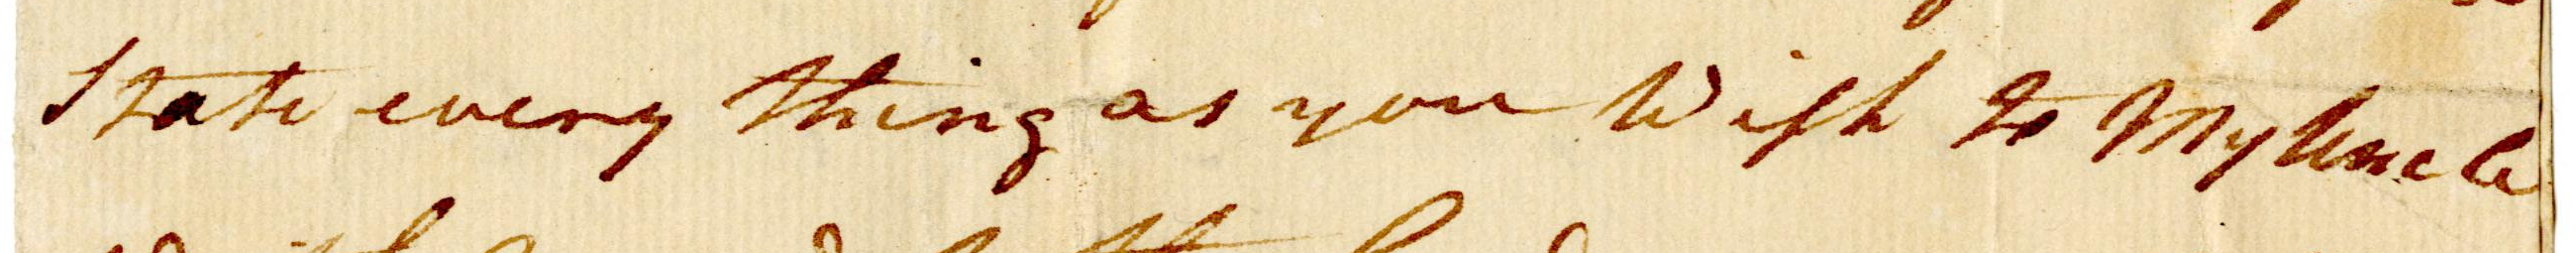State everything as you Wish to My Uncle
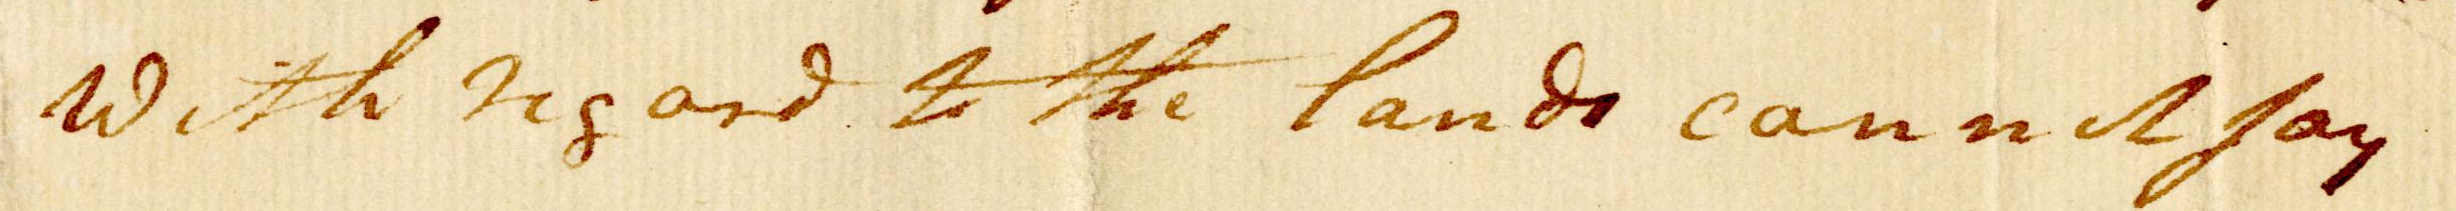with regard to the lands cannot say
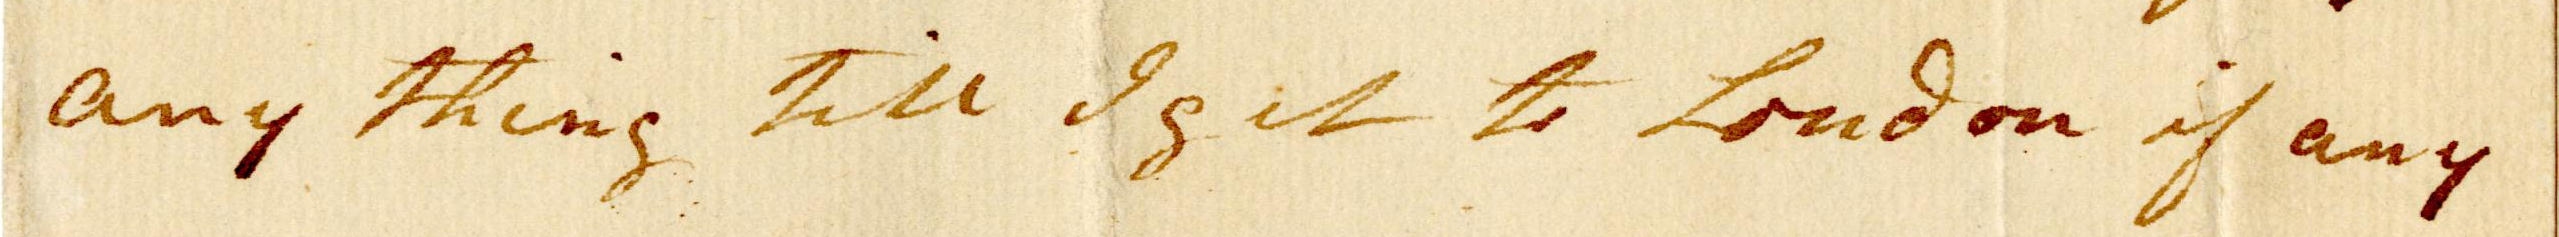any thing till I git to London if any
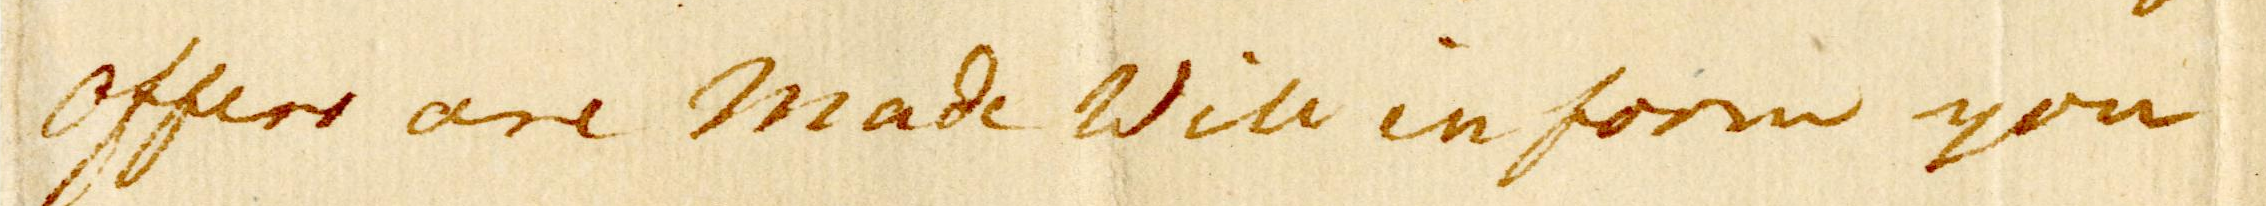offers are made Will inform you
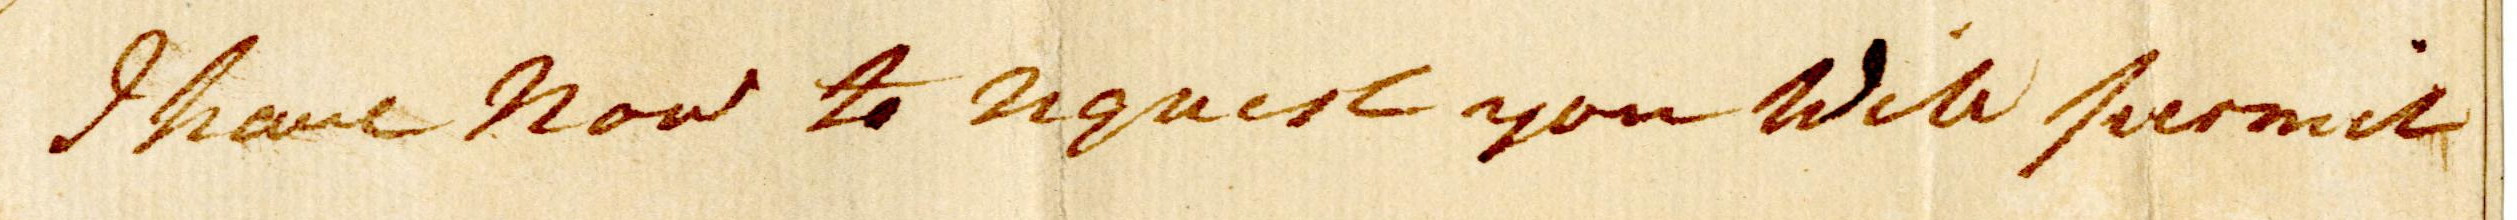I have now to request you will permit
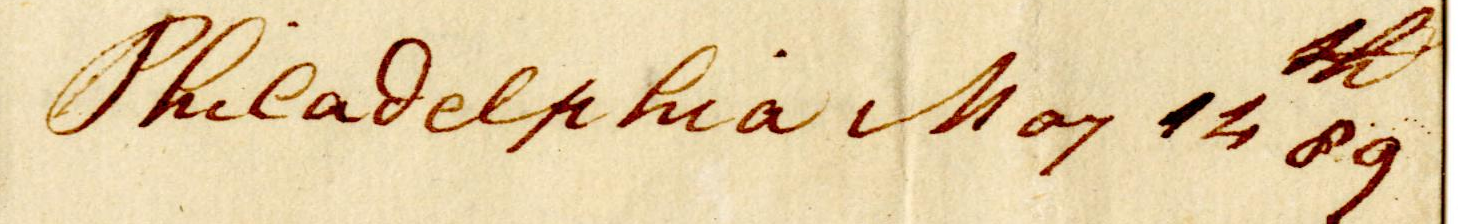Philadelphia May 14^th 89
